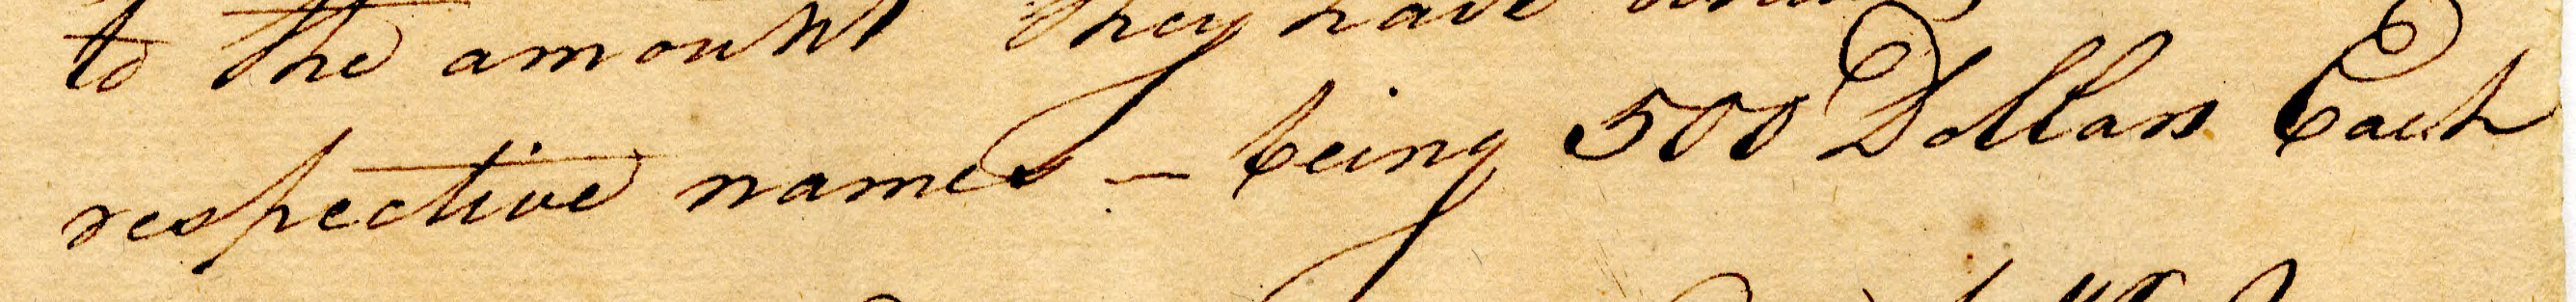respective names- being 500 Dollars Each
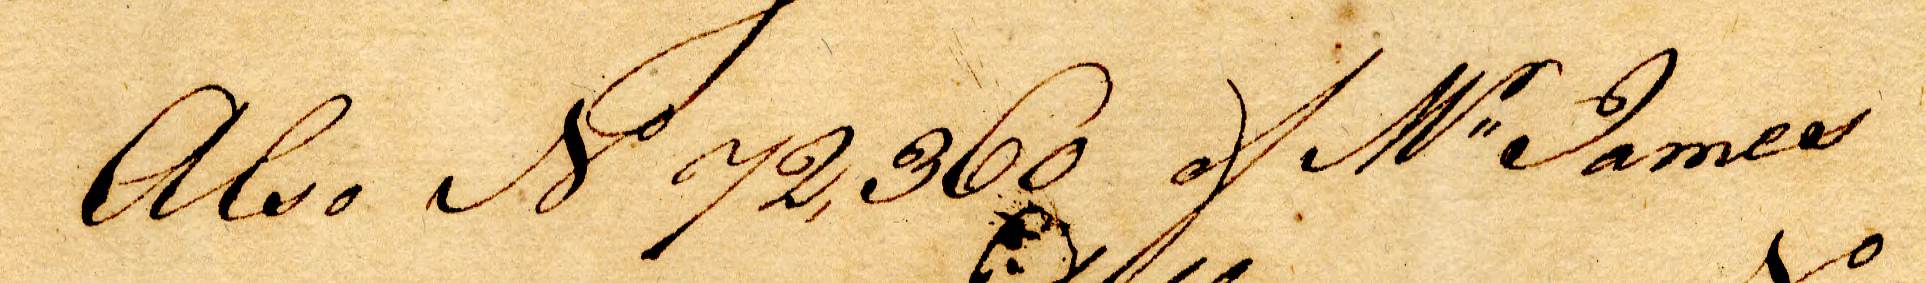Also N^o 72,360 of M^r. James
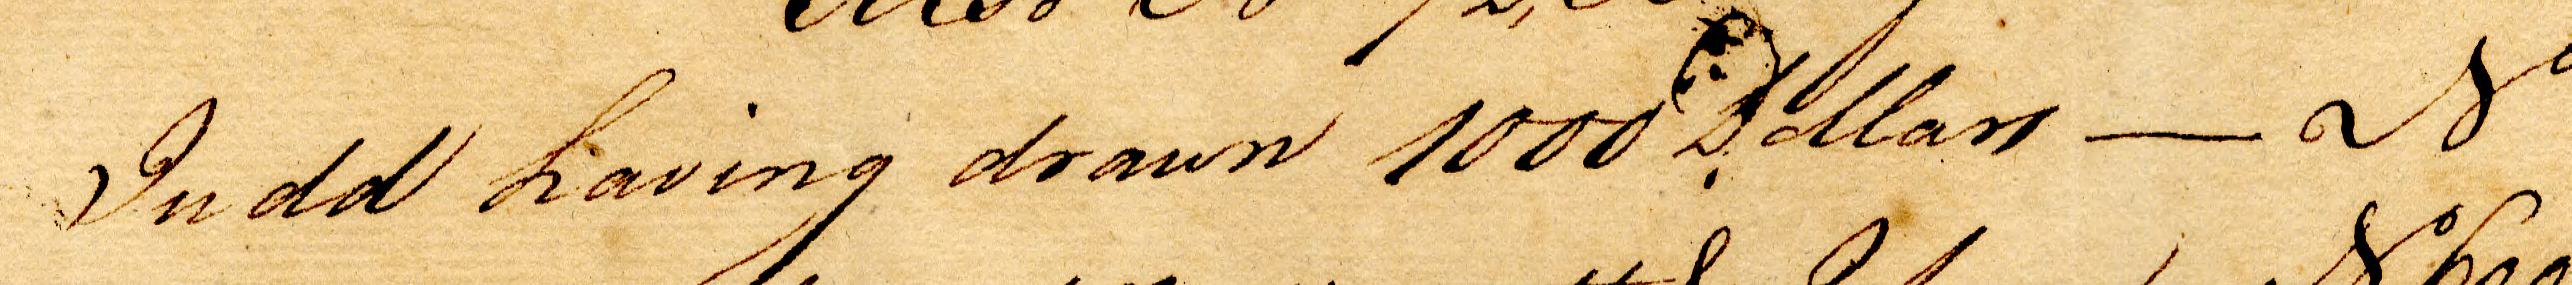Indd having drawn 1000 dollars - N^o
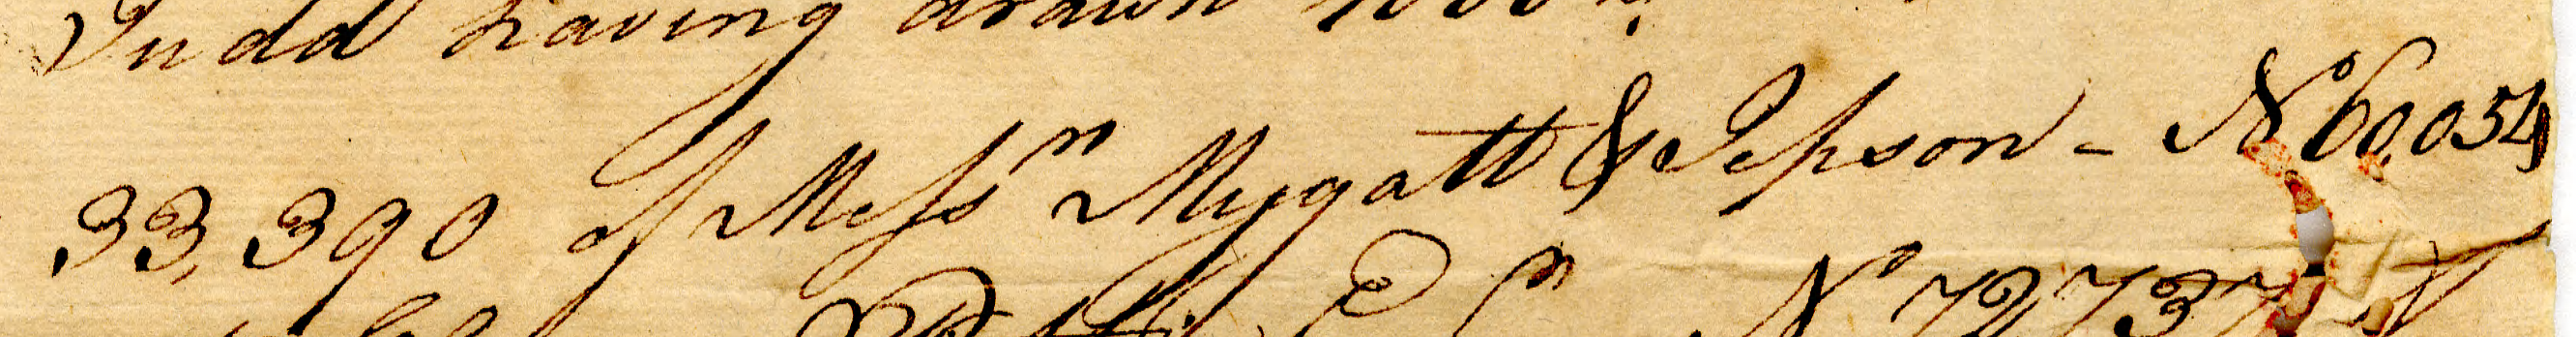33,390 of Mess^r Myggatt & Jepson - N^o 60,054
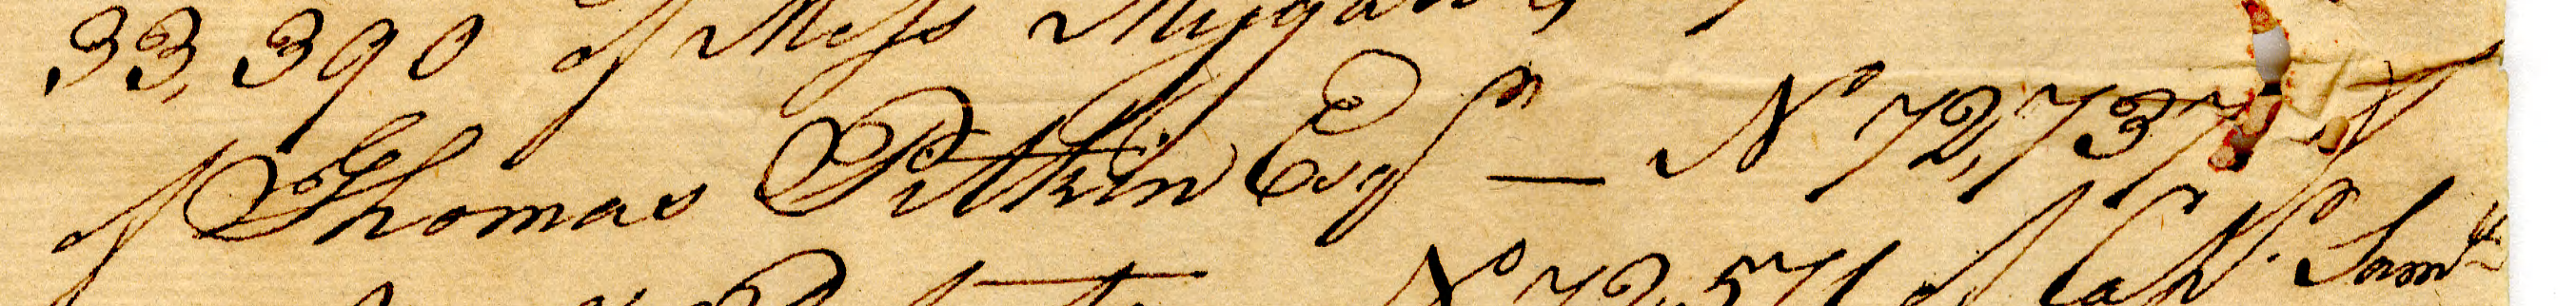of Thomas Pitkin Esq^r - N^o 72,737 of
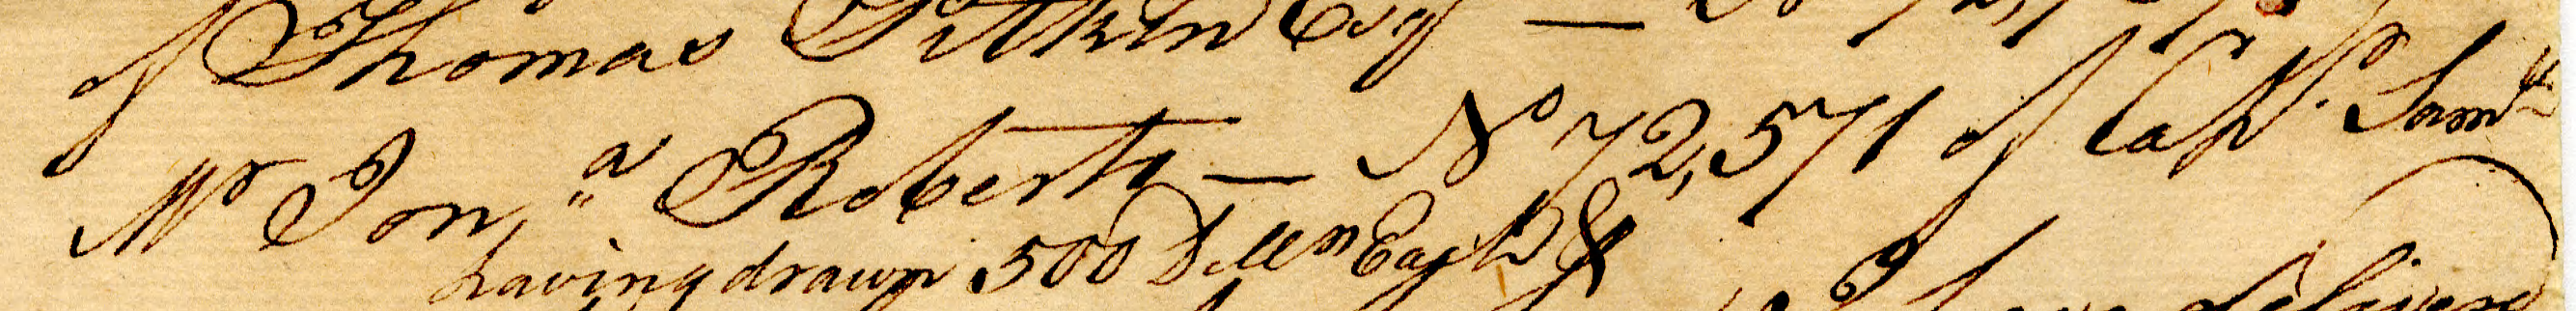M^r Jon.^a Roberts-N^o 72,571 of Cap^t. Saml
